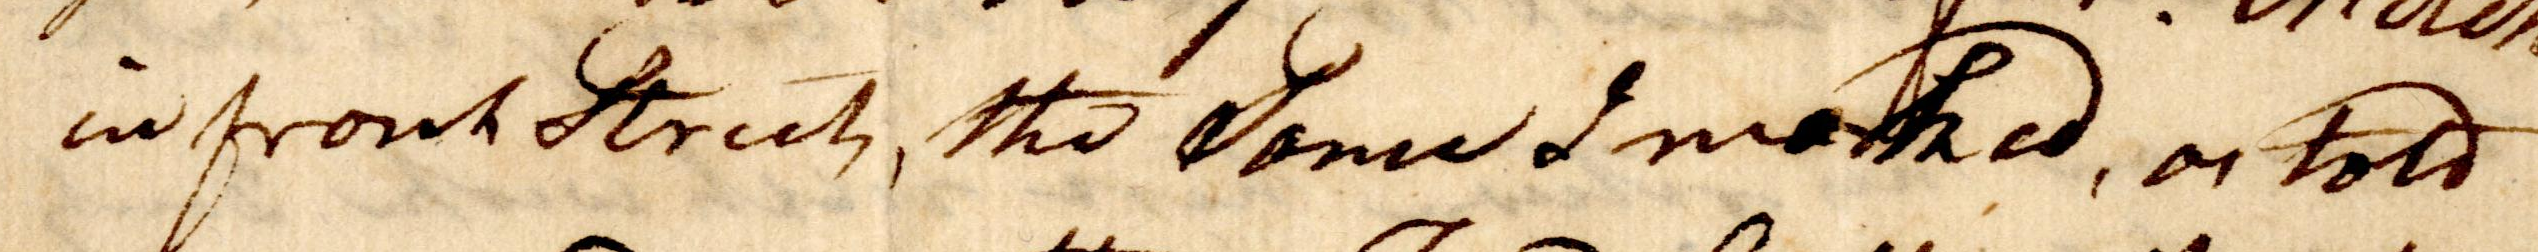in front Street, the same I marked, as told
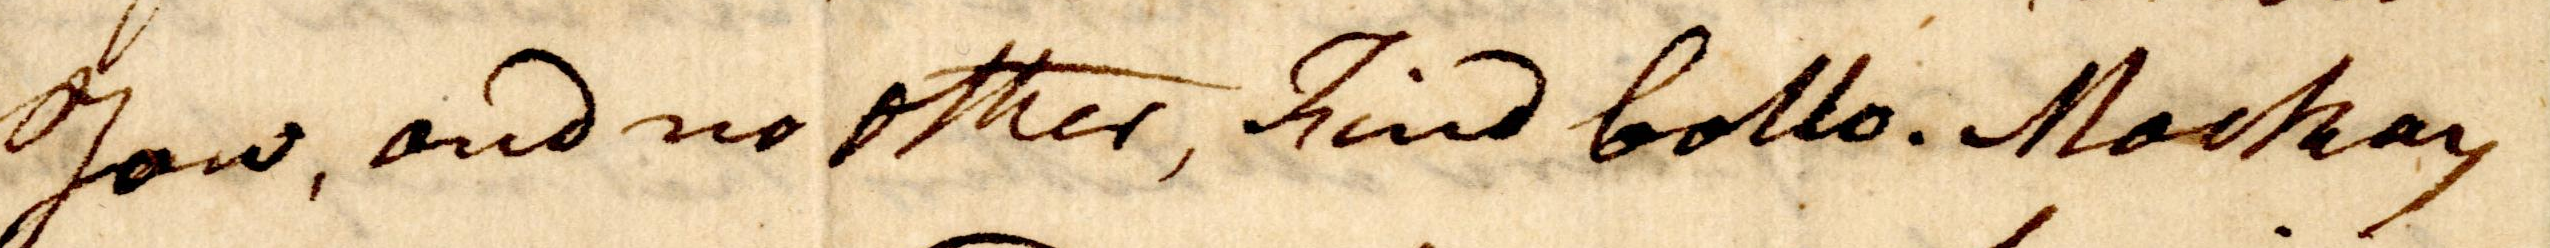you, and no other, Find Collo. Mackay
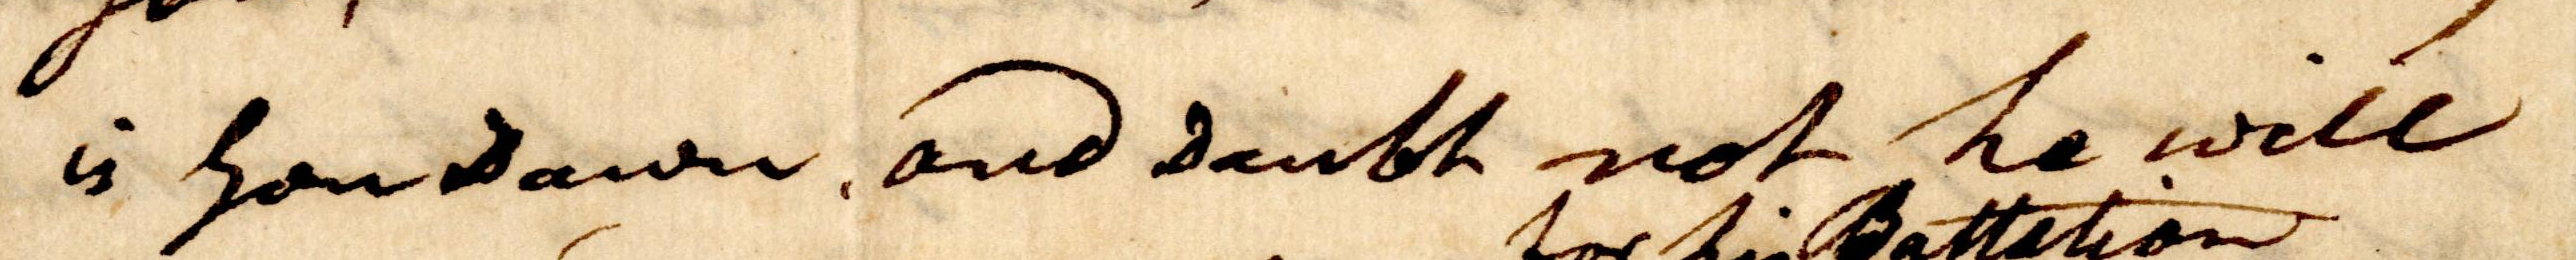is Gon Down and doubt not he will
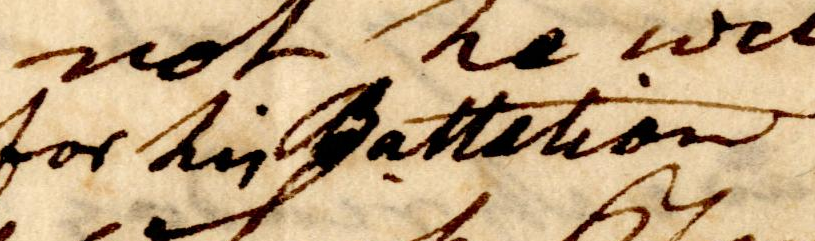for his Battalion
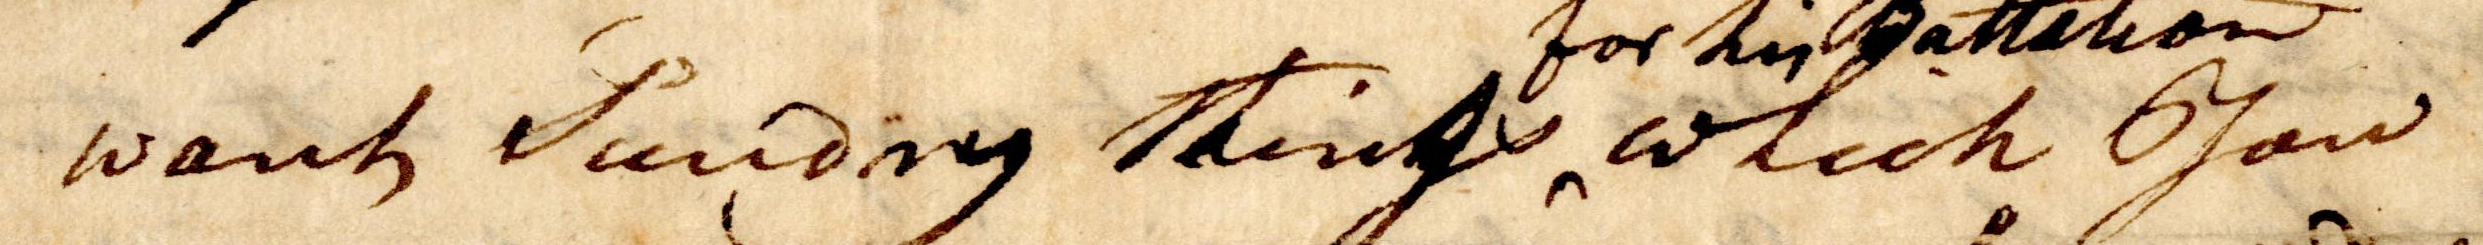want Sundry things which you
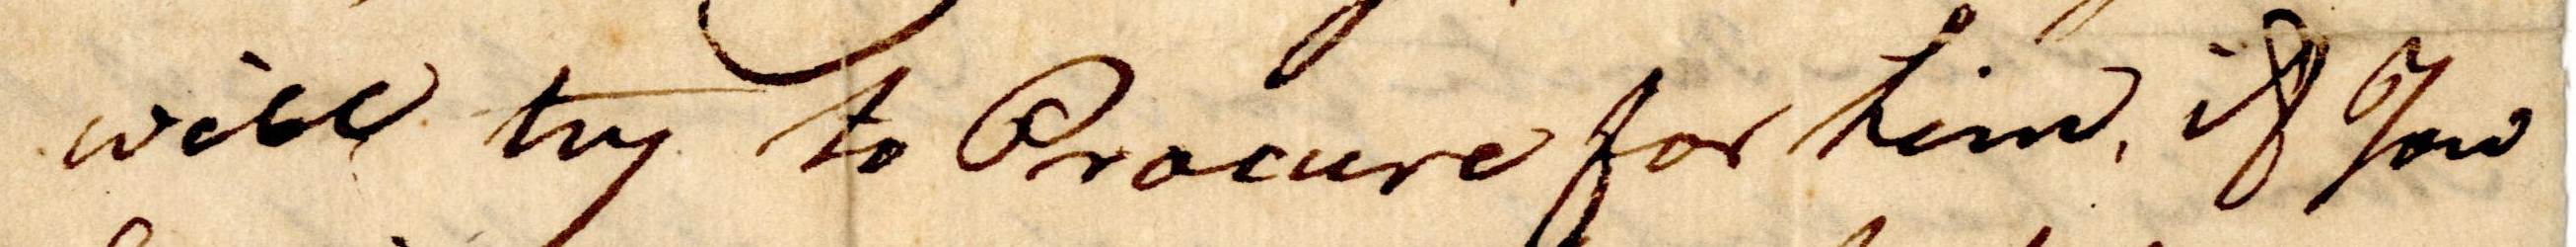will try to Procure for him, if you
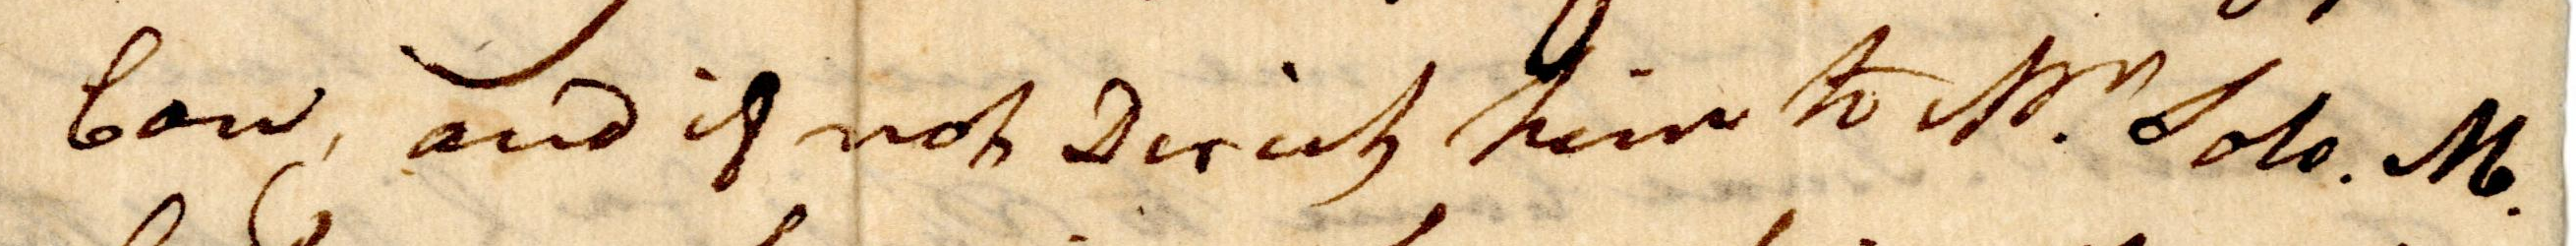Can, and if not Direct him to M^r Solo. M
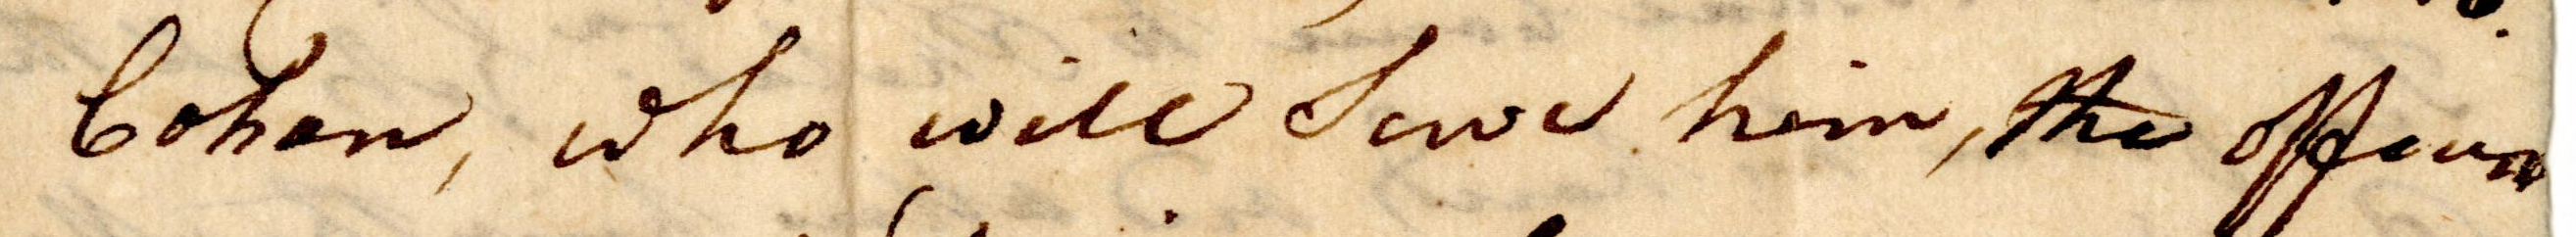Cohan, who will Save him, the officer
